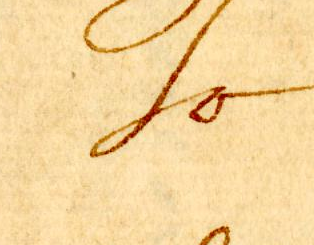To
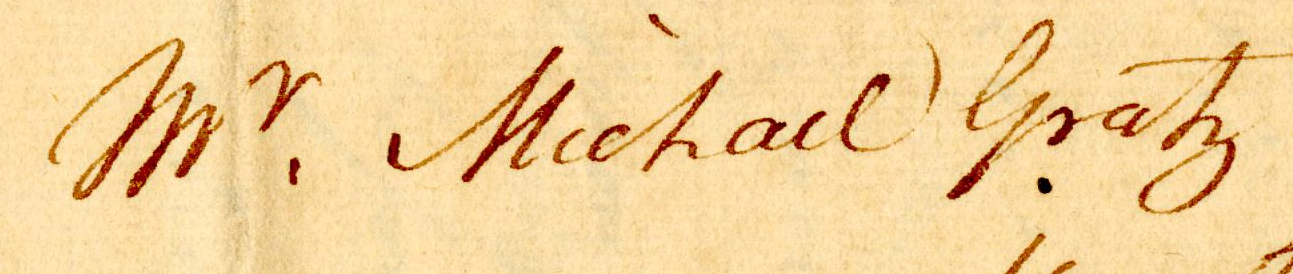M^r Michael Gratz
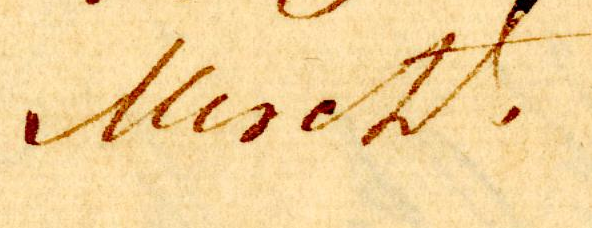Merch^t
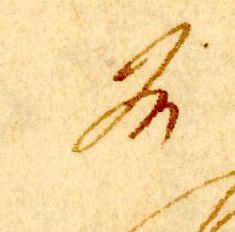In
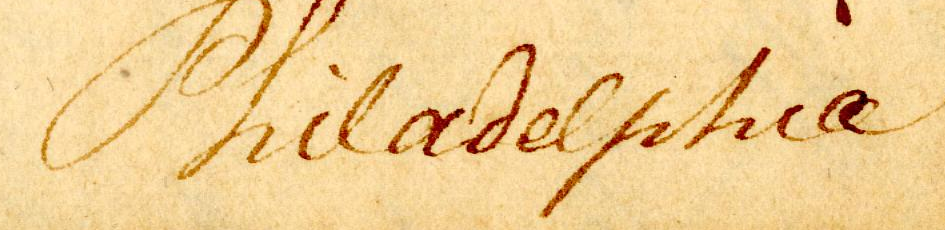Philadelphia
